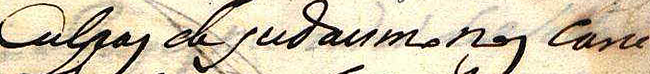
Culpas de judaismo nos carce
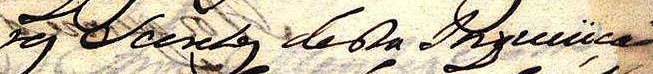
res secretos desta Inquiziçaõ
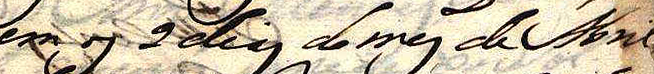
em os 9 dias do mes de Abril
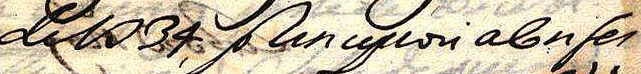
de 1734, prencipiou a confes
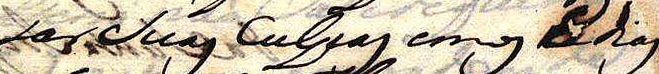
sar suas culpas em os _ dias
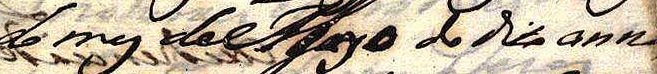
do mes de Mayo do dito anno
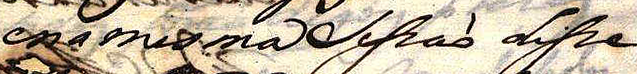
e na mesma sessaõ disse
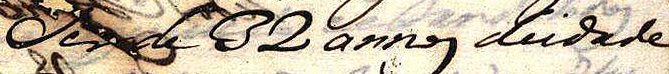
ser de 32 annos de idade
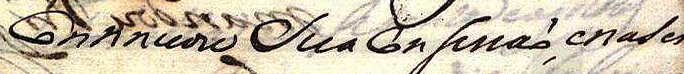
Continuou sua confessaõ, e na ses
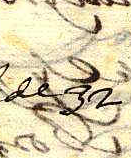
Jde 32
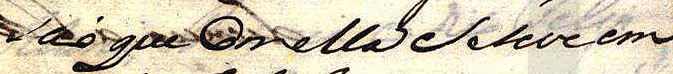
saõ que Com ella se teve em
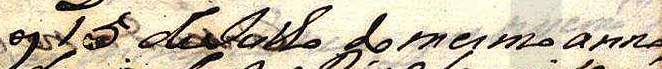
os 15 de Iulho do mesmo anno,
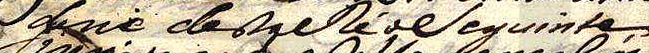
disse desta Ré o seguinte,
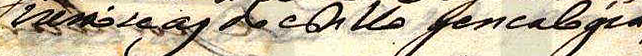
Fizeraõse as do estillo genealogia,
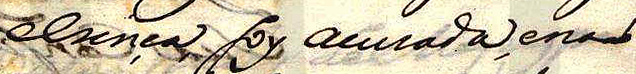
e crença, foy acuzada, e naõ
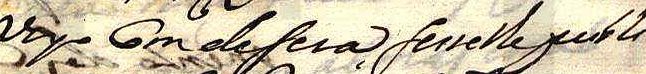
veyo com defeza, fesselhe publi
